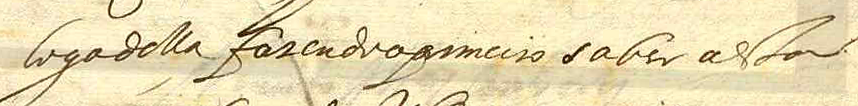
logo della fazendo o primeiro saber a esta
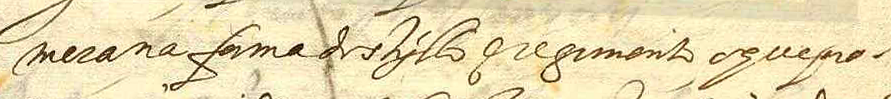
meza na forma do styllo e regimento, o que pro
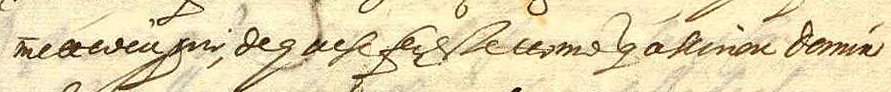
metteo cūprir, de que se fez este termo q̄ assinou domin
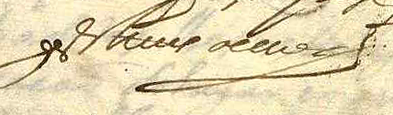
gos esteues o escrey
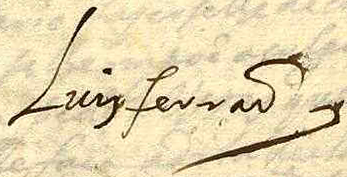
Luis ferraõ
